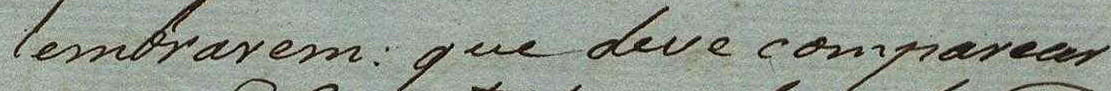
lembrarem que deve comparecer
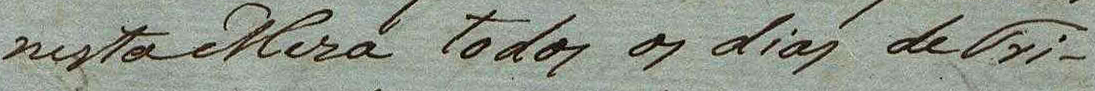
nesta Meza todos os dias de Tri
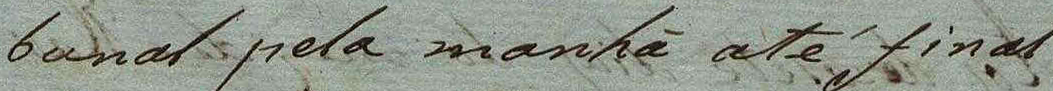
bunal pela manhã até final
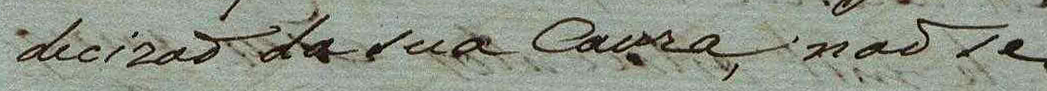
decizaõ da sua Cauza, não se
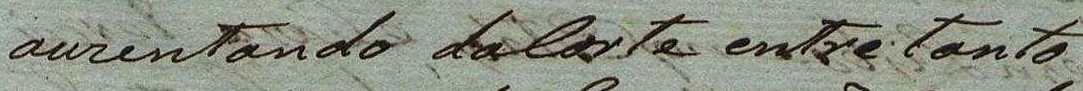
auzentando da Corte entretanto
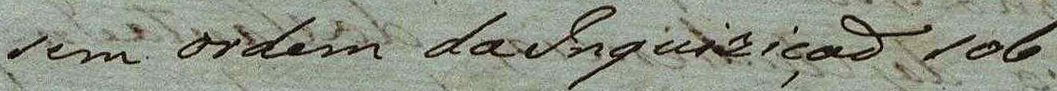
sem ordem da Inquizição sob
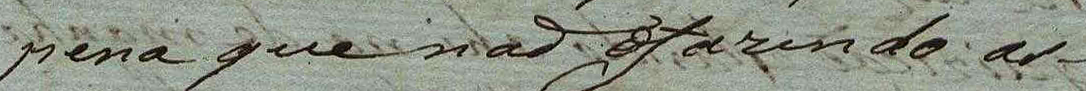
pena que naõ o fazendo as
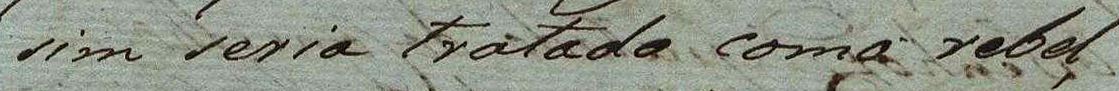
sim seria tratado como rebel
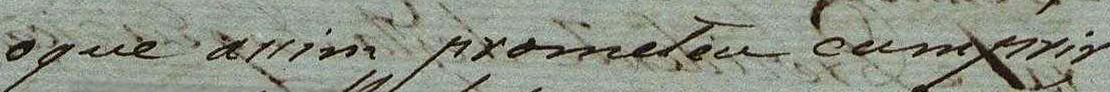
o que assim prometeu cumprir
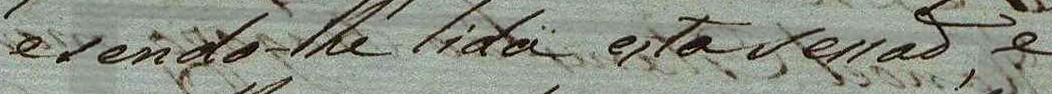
e sendo-lhe lida esta sessaõ, e
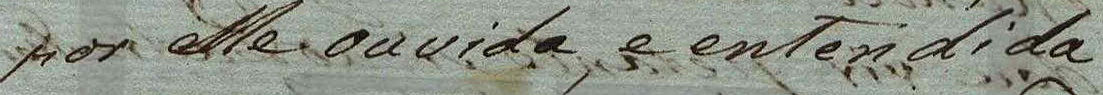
por elle ouvida, e entendida
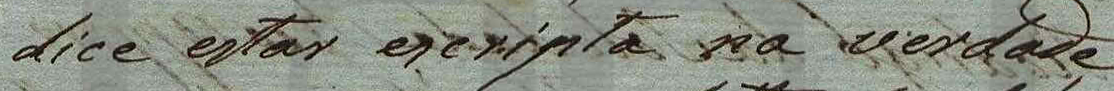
dice estar escripta na verdade
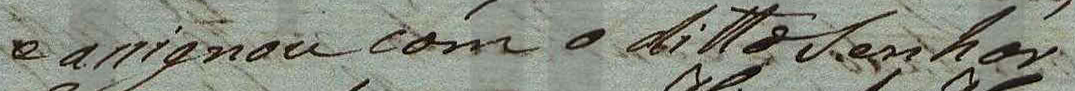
e assignou com o ditto Senhor
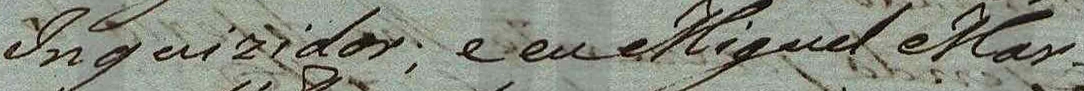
Inquizidor; e eu Miguel Mar
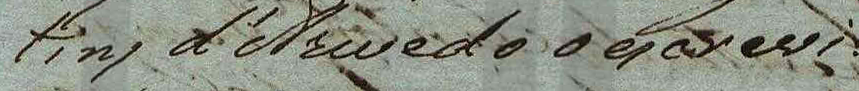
tins d'Oliveira o escrevi
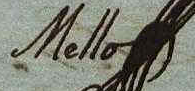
Mello
